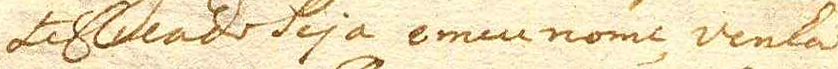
teficado seja o meu nome, venha
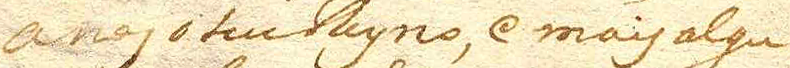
a nos o teu Reyno, e mais algu
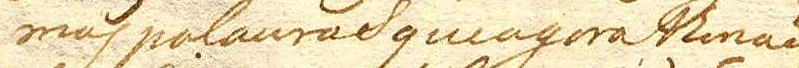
mas palauras que agora lhe naõ
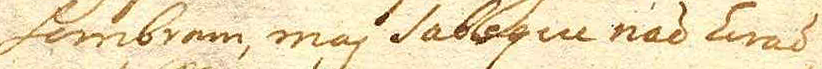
Lembram, mas sabe que naõ heraõ
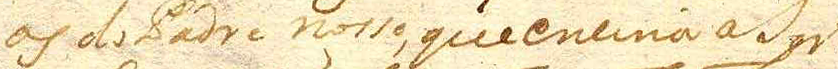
as do Padre nosso, que encina a Igra.
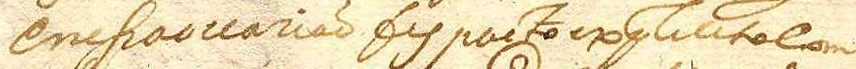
e nessa occaziaõ fes pacto explicito com
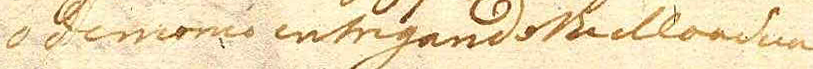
o demonio entregandolhe ella a sua
